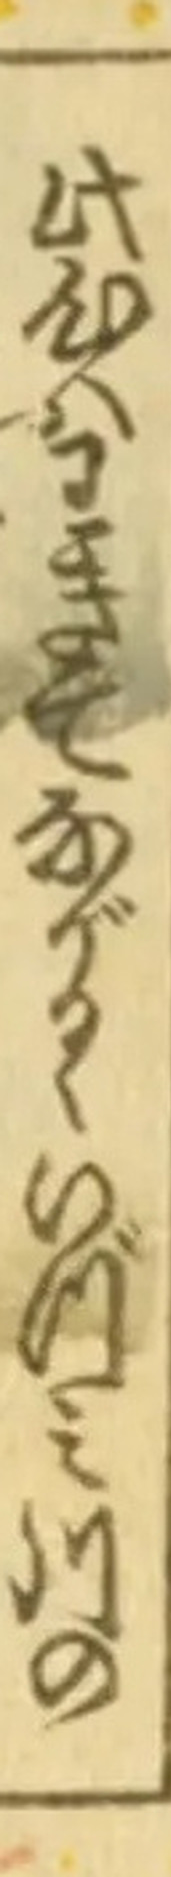此心はわきてながるゝいづみ川の
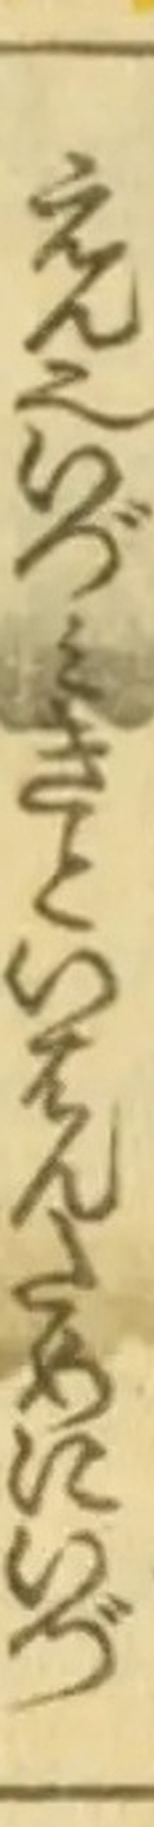えん也いずみきといはんためにいづ
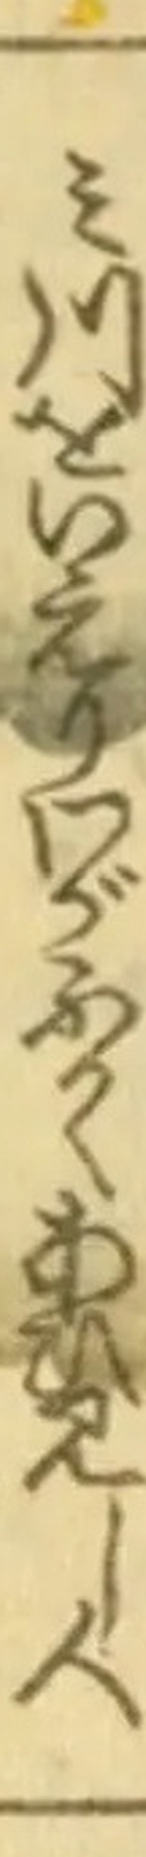み川をいえりわがふかくあひ見し人
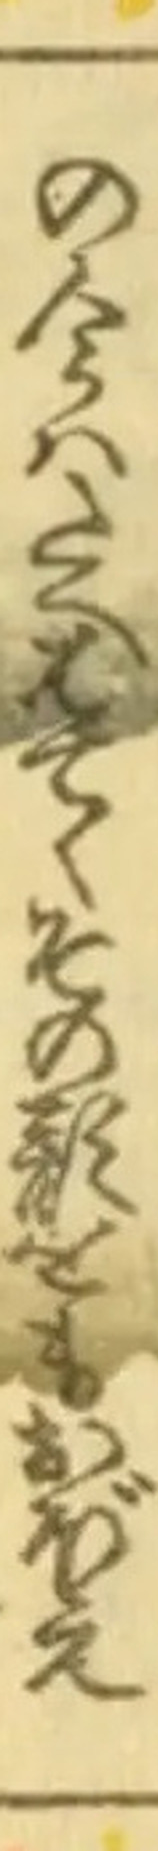の今はたへはてゝその顔をもおぼえ
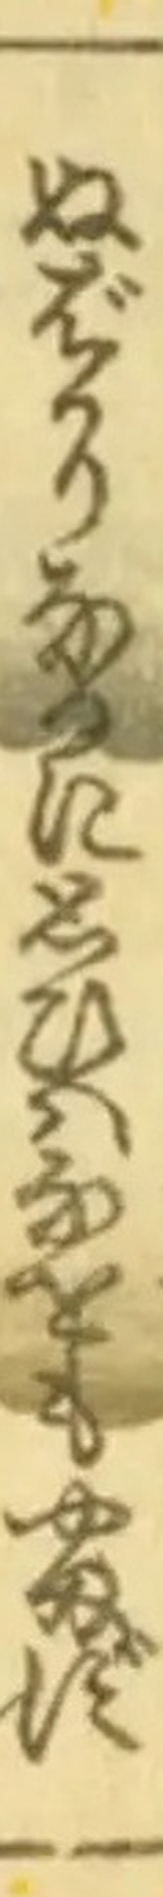ぬばかりなるに思ひはなをもやまず
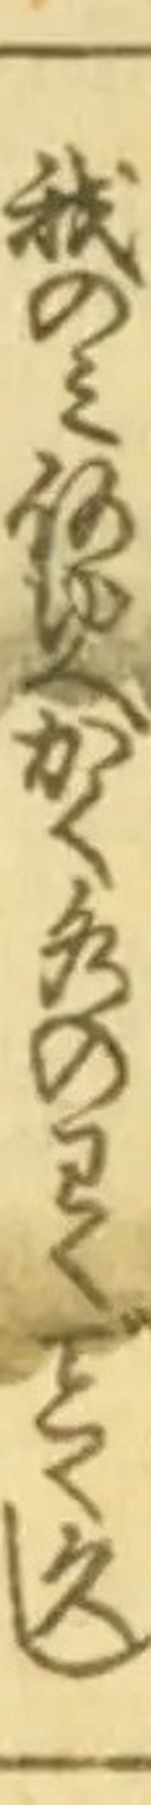我のみ何ゆへかく水のわくごとく久し
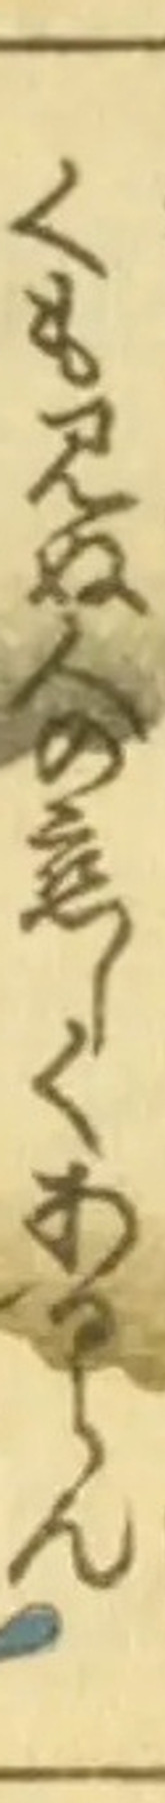くも見ぬ人の恋しくあるらん
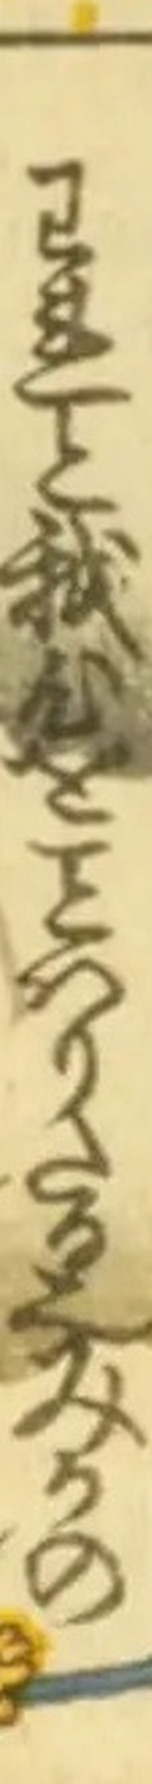われと我心をことはりたる也みかの
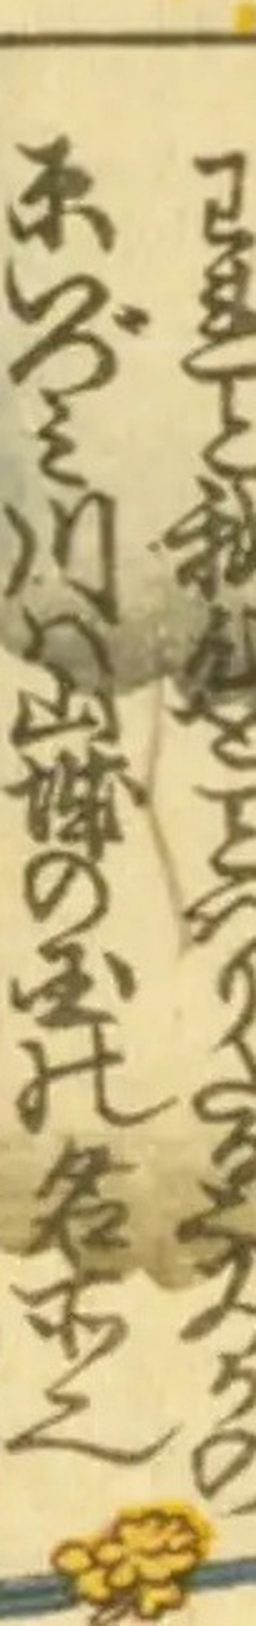原いづみ川は山城の国の名所也
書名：百人一首絵抄　廿七　中納言兼輔
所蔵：国立国会図書館 National Diet Library, JAPAN
